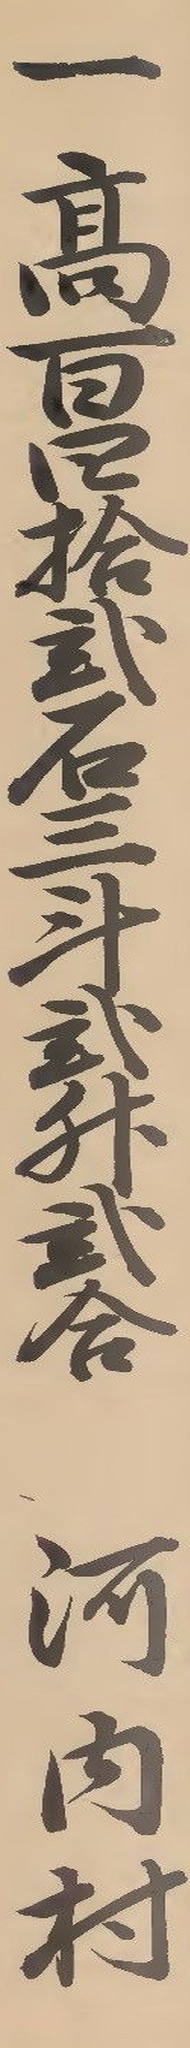一高百四拾弐石三斗弐升弐合河内村
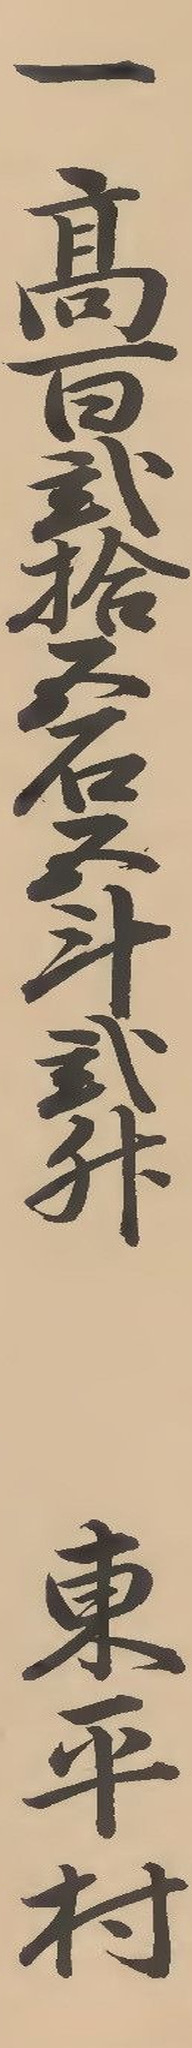一高百弐拾五石五斗弐升東平村
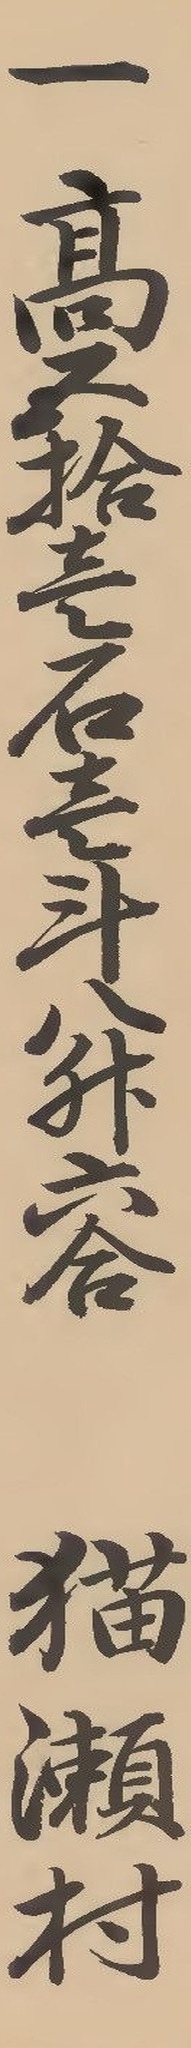一高五拾壱石壱斗八升六合猫瀬村
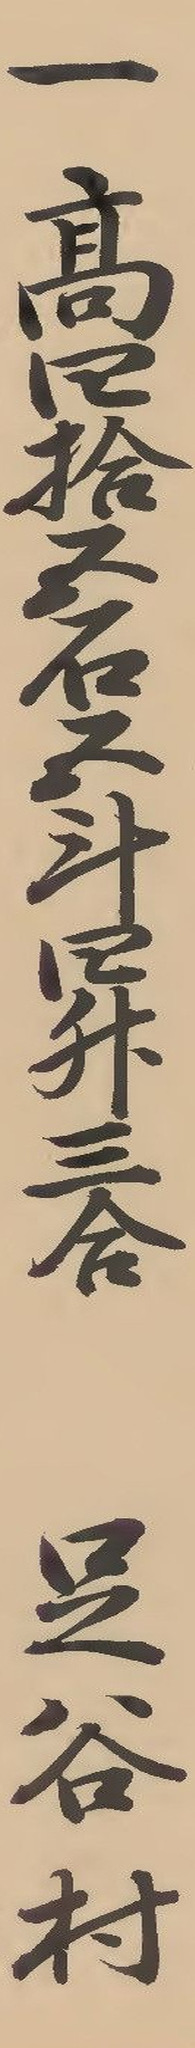一高四拾五石五斗四升三合足谷村

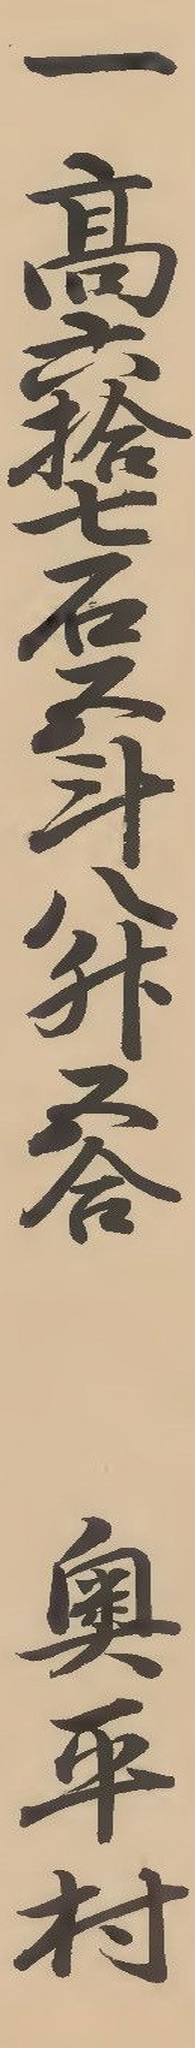一高六拾七石五斗八升五合奥平村
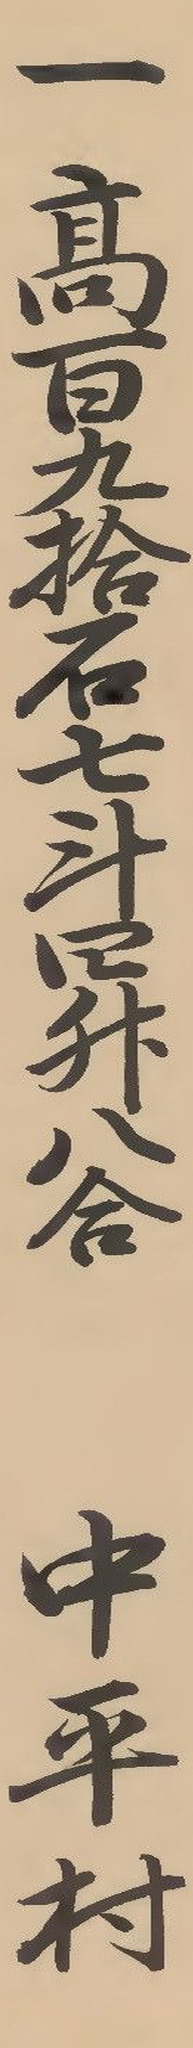一高百九拾石七斗四升八合中平村
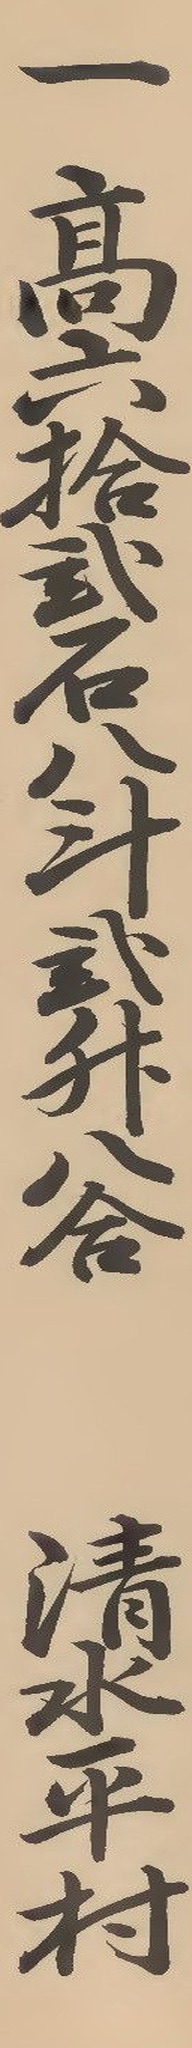一高六拾弐石八斗弐升八合清水平村
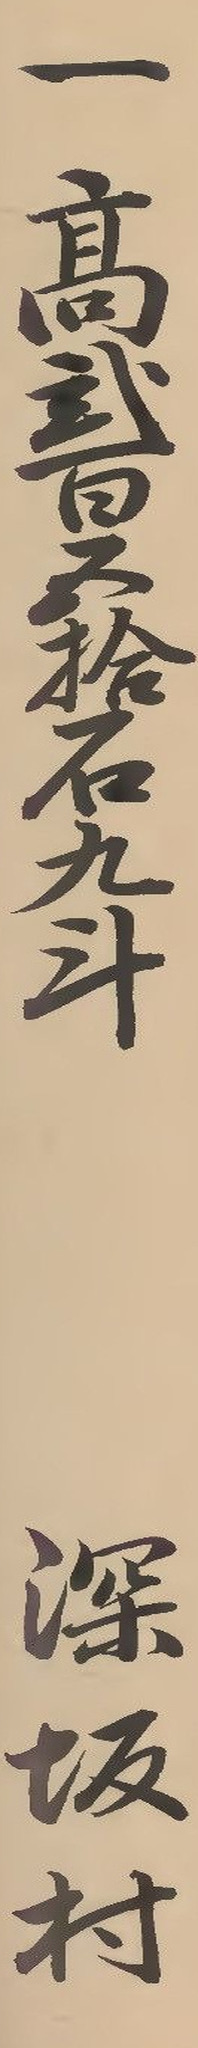一高弐百五拾石九斗深坂村
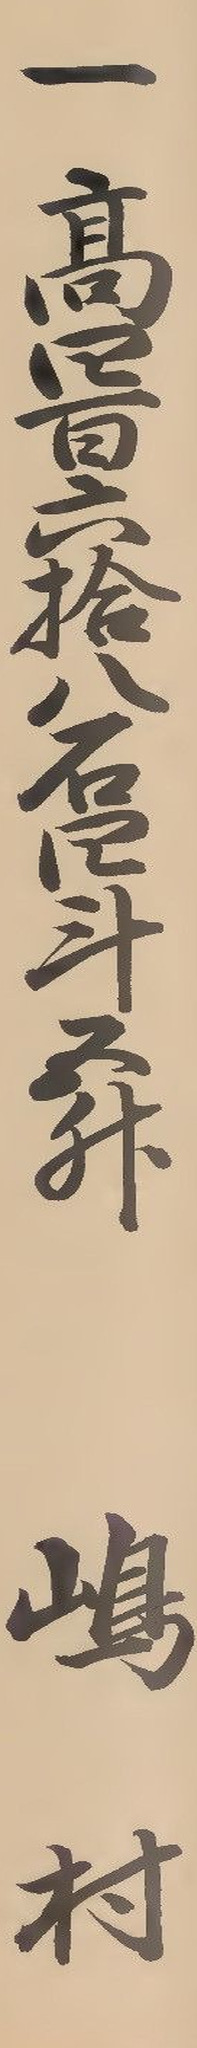一高四百六拾八石四斗五升島村
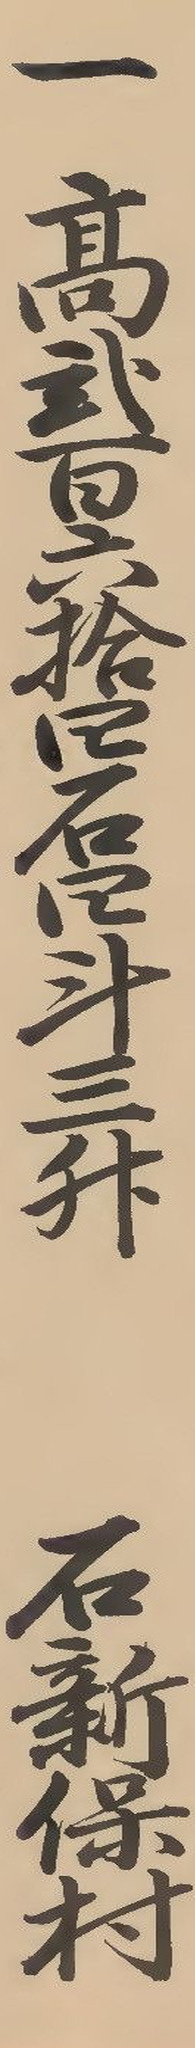一高弐百六拾四石四斗三升石新保村

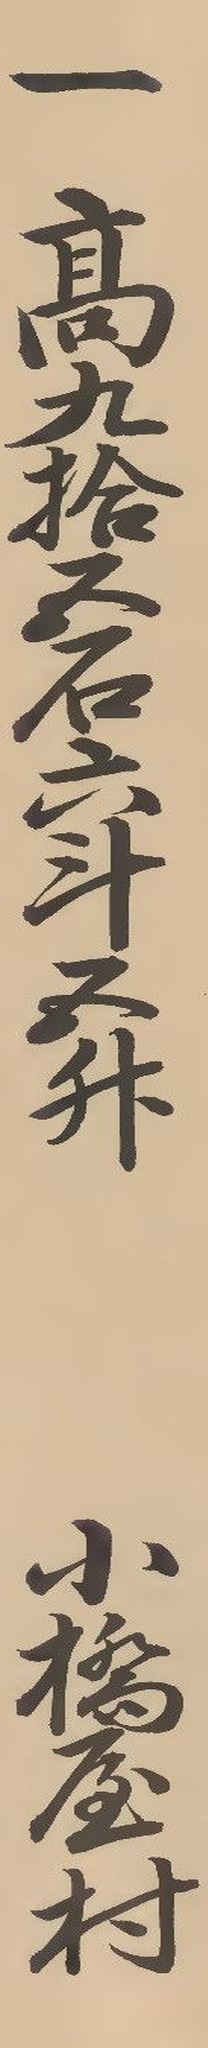一高九拾五石六斗五升小橋屋村
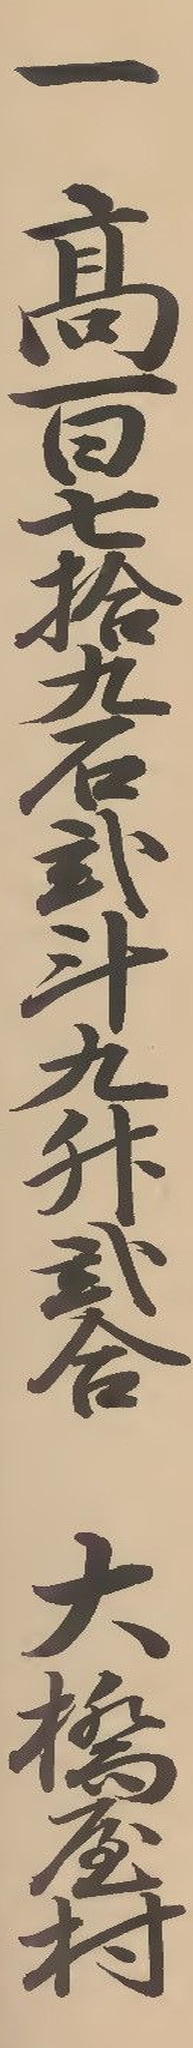一高百七拾九石弐斗九升弐合大橋屋村
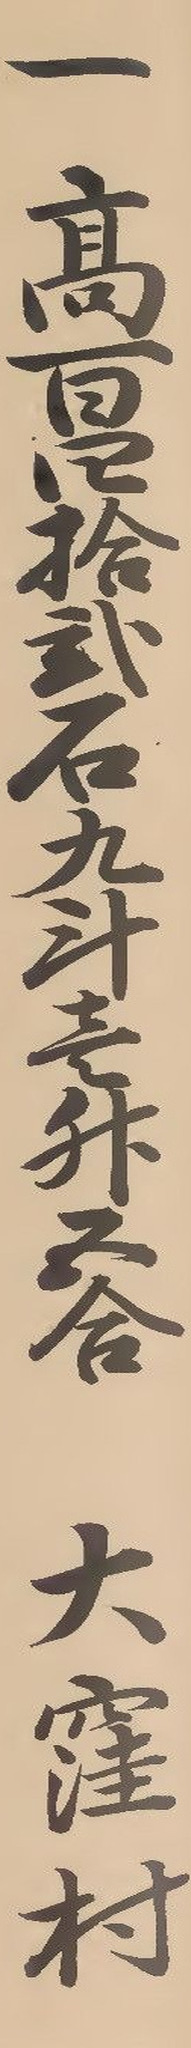一高百四拾弐石九斗壱升五合大窪村
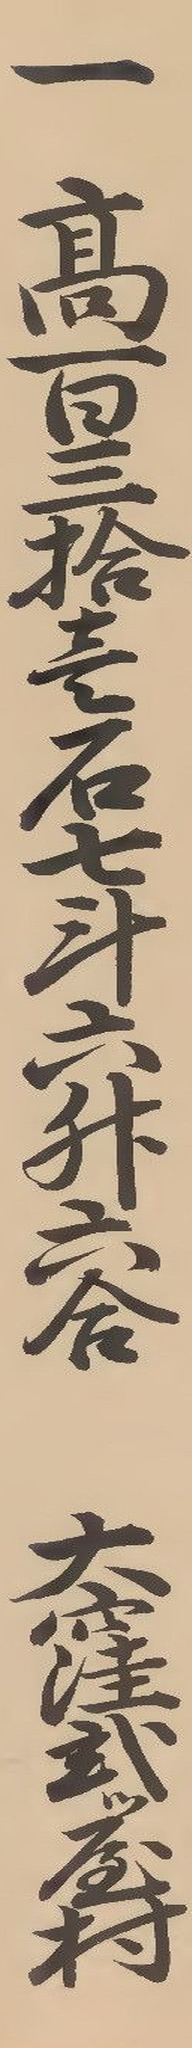一高百三拾壱石七斗六升六合大窪弐ツ屋村
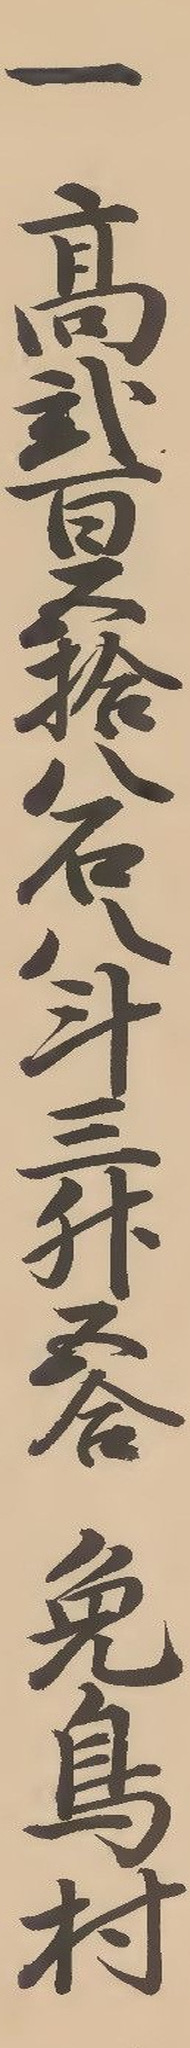一高弐百五拾八石八斗三升五合免鳥村
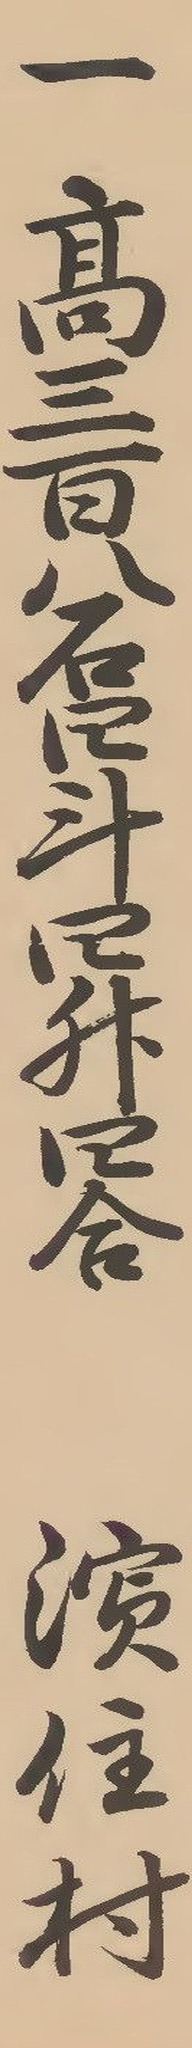一高三百八石四斗四升四合浜住村
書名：越前国郷帳
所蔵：国立公文書館 National Archives of Japan
